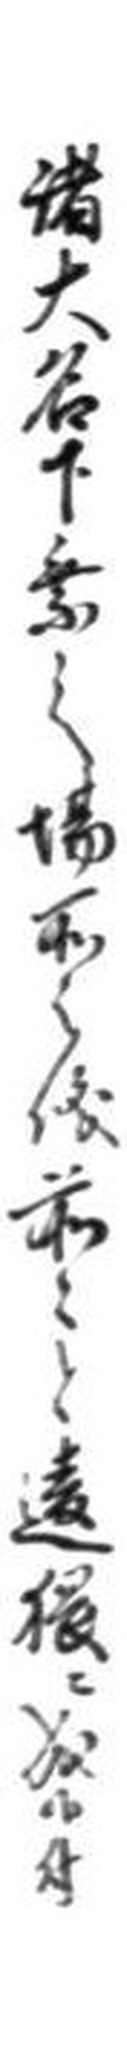諸大名下乗之場所之儀前々と違猥ニ成候付
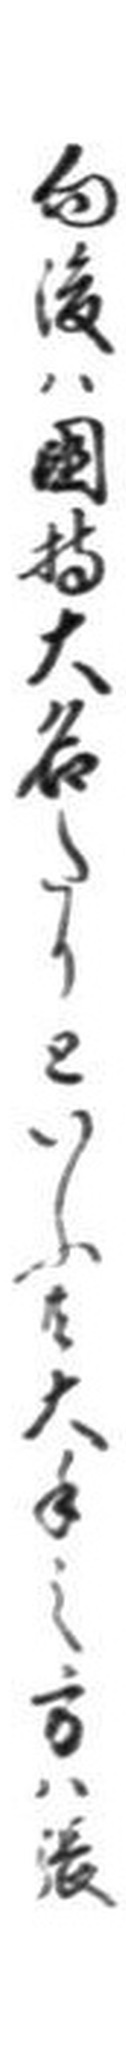向後ハ国持大名たりといふ共大手之方ハ張
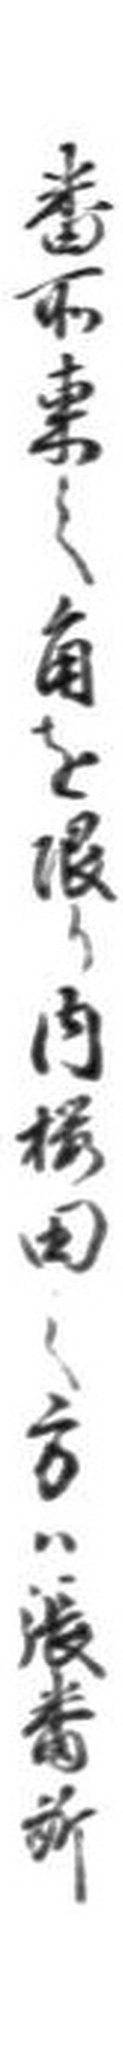番所東之角を限り内桜田之方ハ張番所
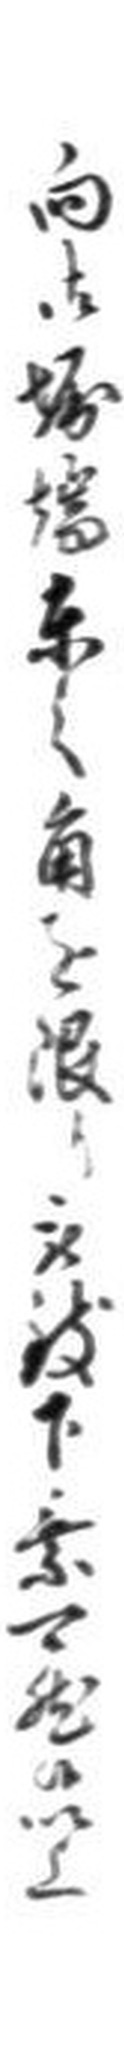向御堀端東之角を限り被致下乗可然候以上
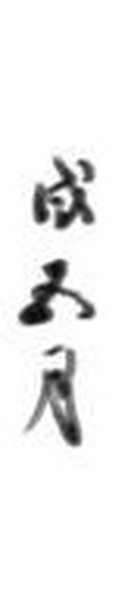戌五月
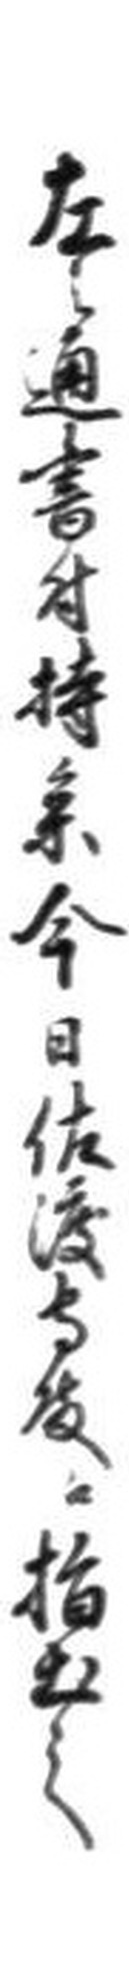左之通書付持参今日佐渡守殿江指出之

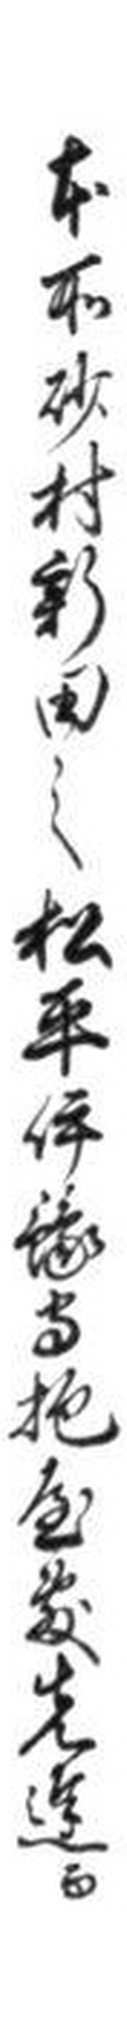本所砂村新田之松平伊予守抱屋敷先達而
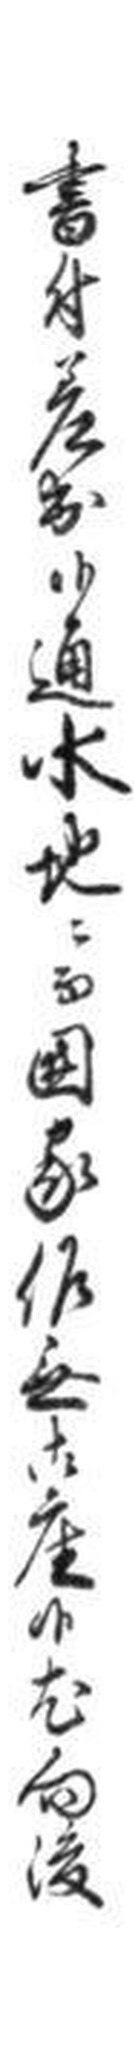書付差出候通水地ニ而囲家作無御座候尤向後
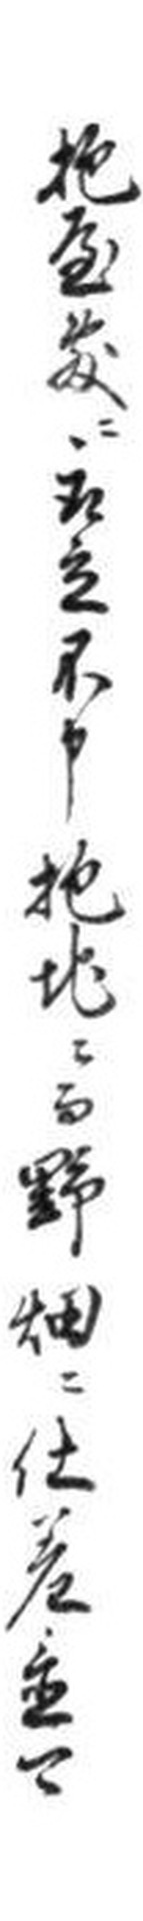抱屋敷ニ取立不申抱地ニ而野畑ニ仕差置可
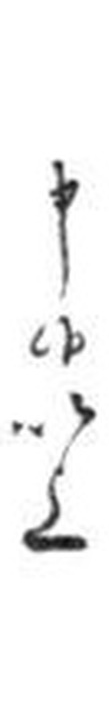申候以上
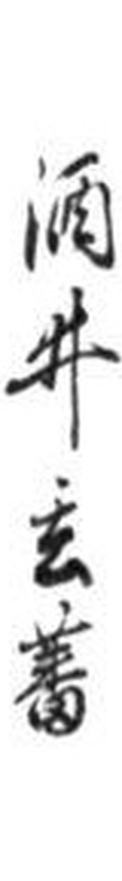酒井玄蕃
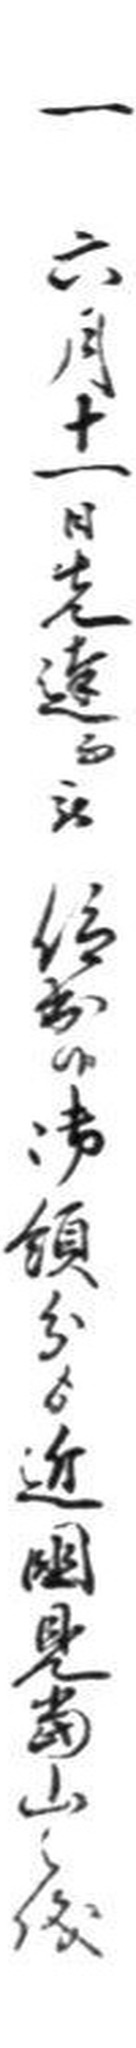一六月十一日先達而被仰出候御領分ゟ近国見当山之儀
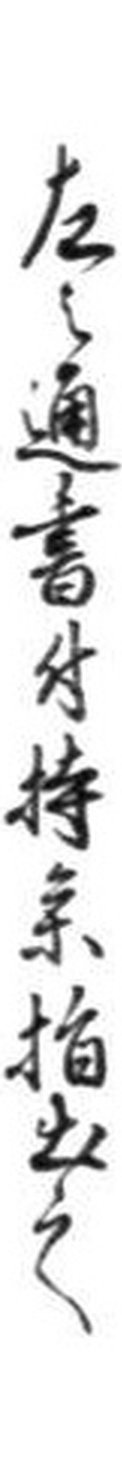左之通書付持参指出之
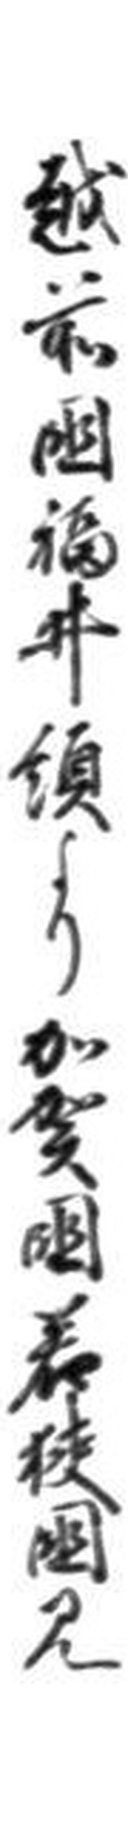越前国福井領より加賀国若狭国見
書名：家譜 三十二 吉邦公 従享保二年到享保三年
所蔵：福井県文書館 Fukui Prefectural Archives
